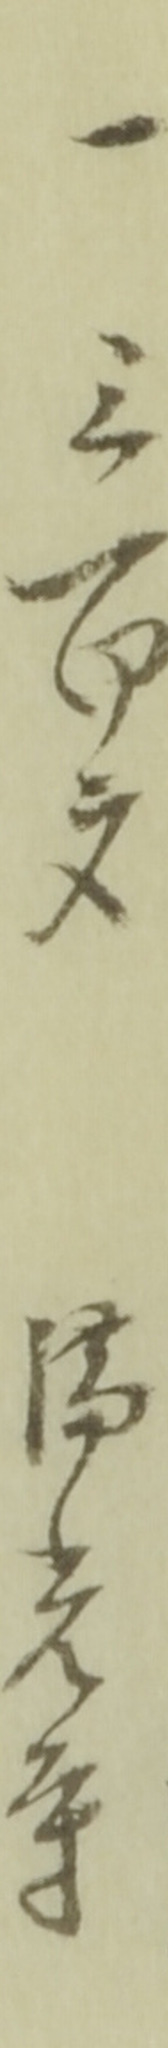一三百文満光寺
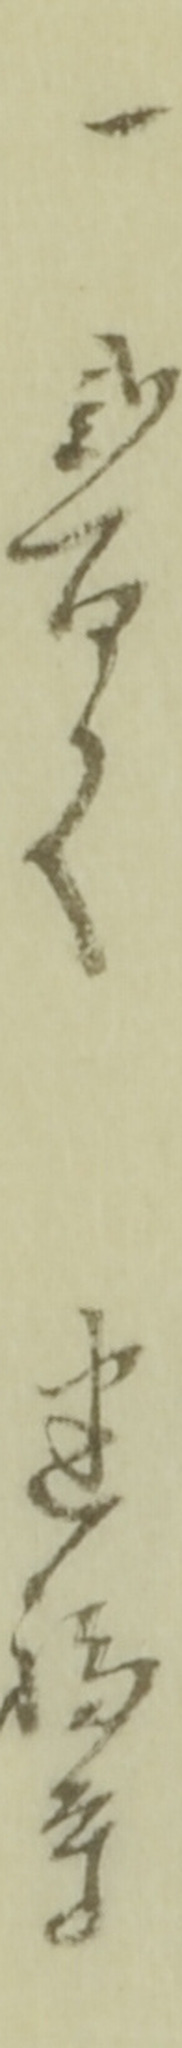一弐百文蓮福寺
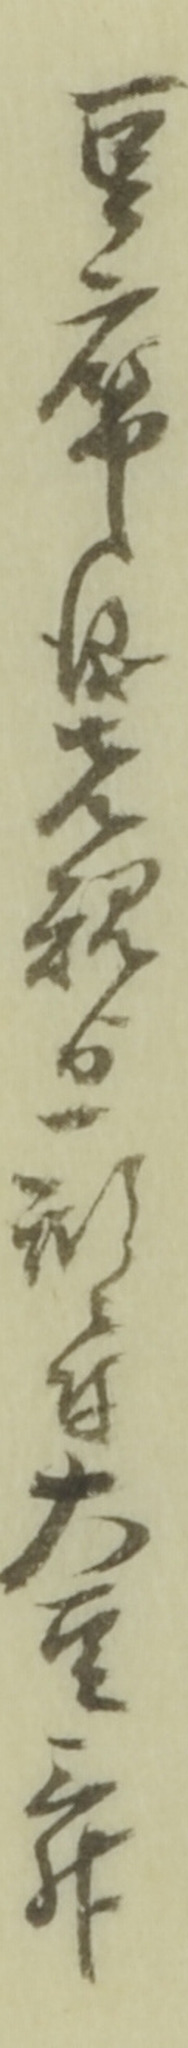豆腐候儀先規より一形二付大豆三升
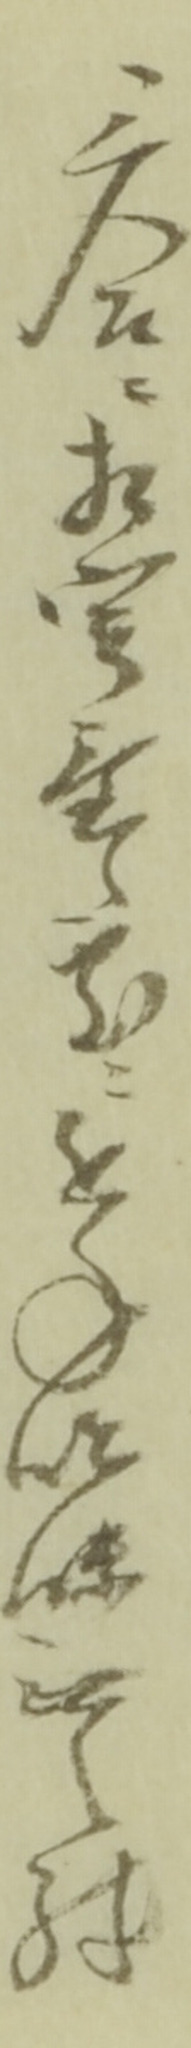三合二相定置候處二近年吟味無之対
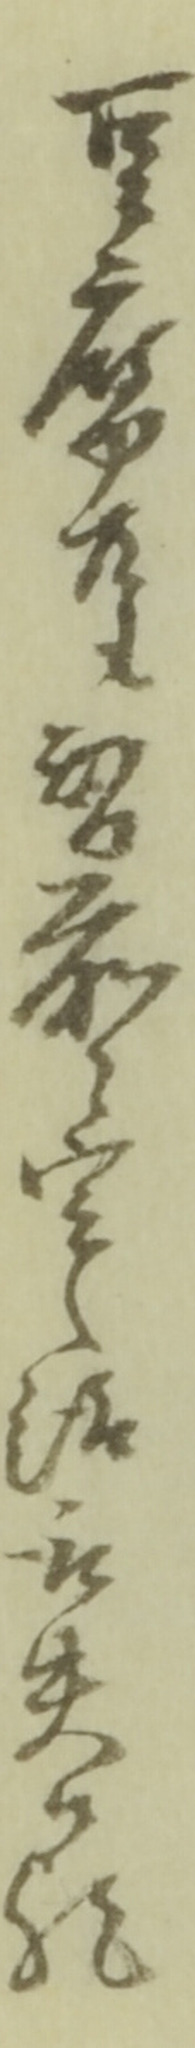豆腐共も替前之定候趣取失候就
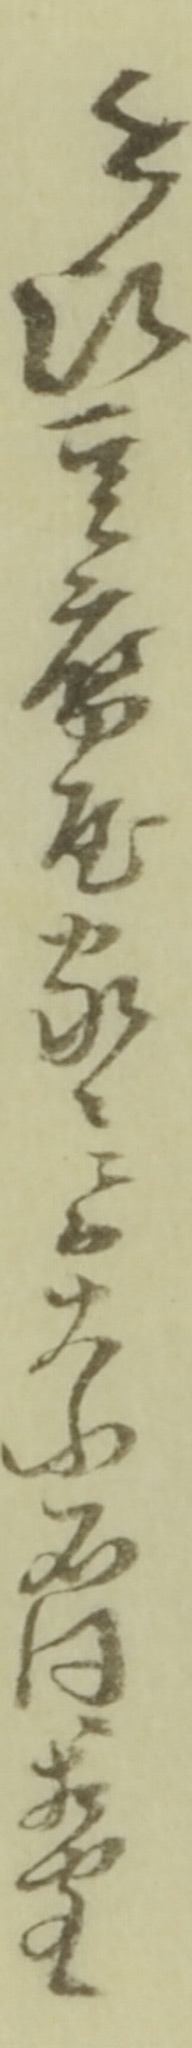を以豆腐屋家々二而大小不同二相聞候
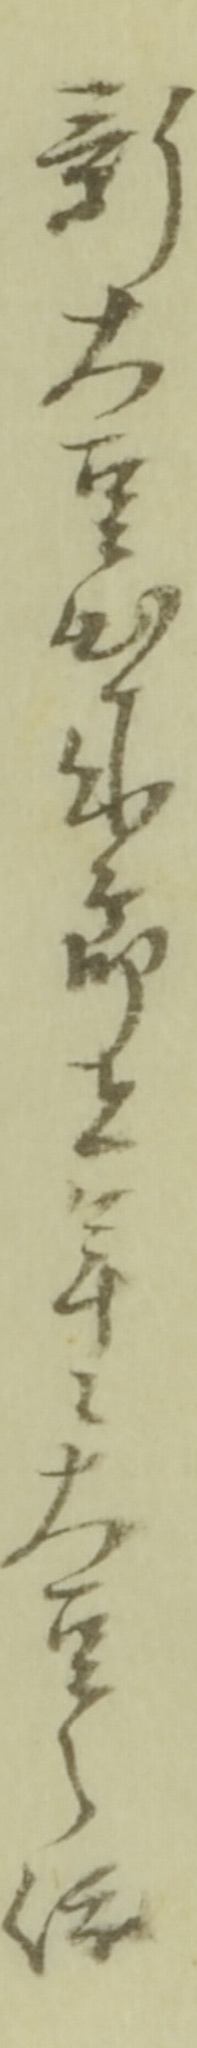新大豆出来候節者年々大豆之依
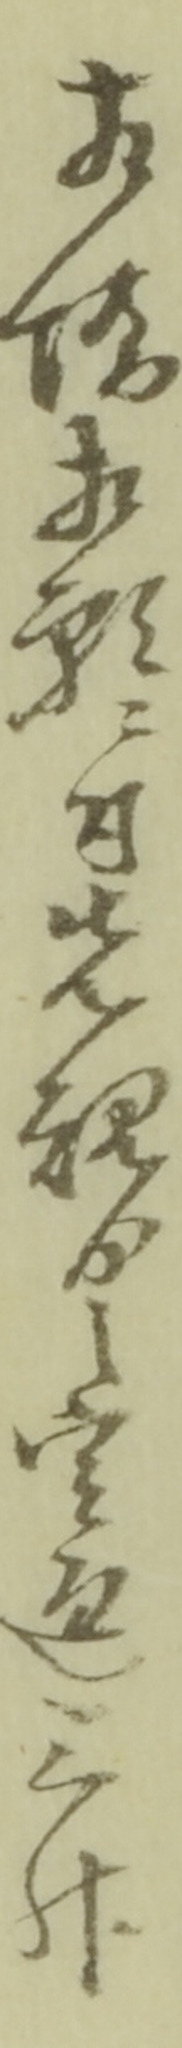相場相願二付先規より之定通三升
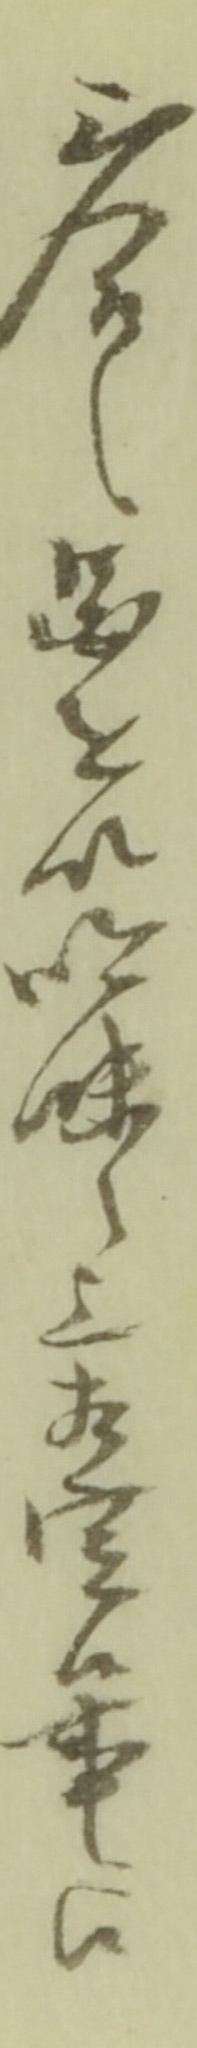三合之品を以吟味之上相定候事二候
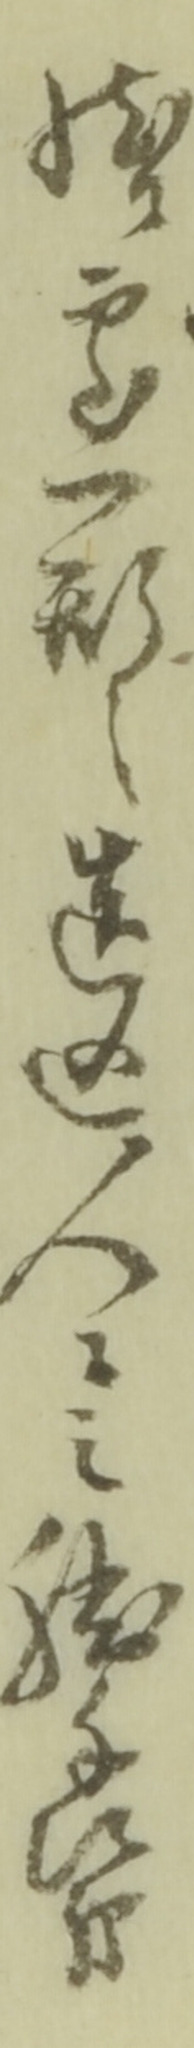然ル處一形之造込人々之勝手次第
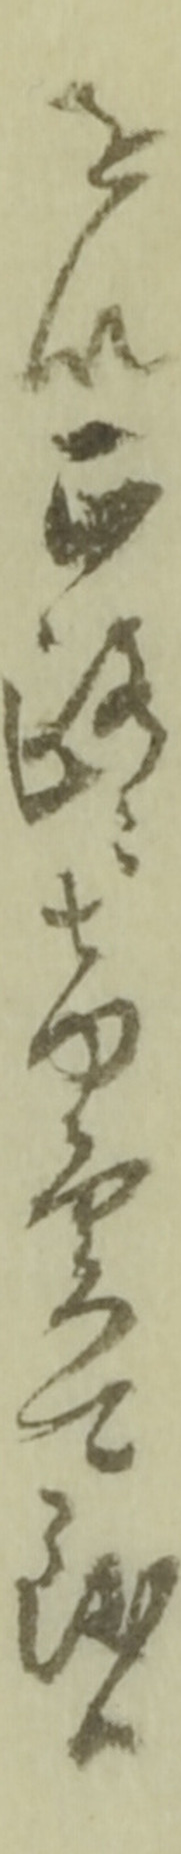を以正断二商売可致候

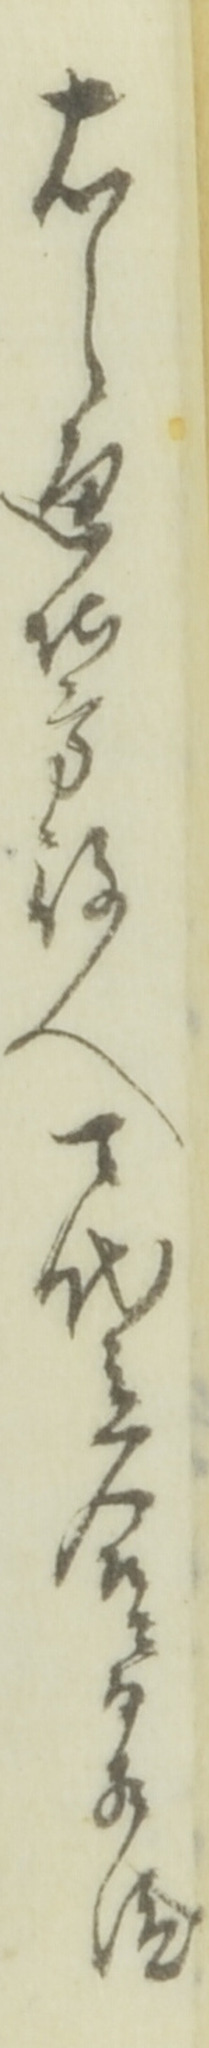右之通在方役人て代立会二而相渡
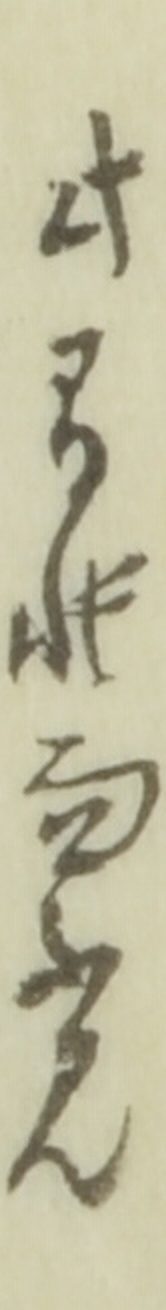此間帳面不見
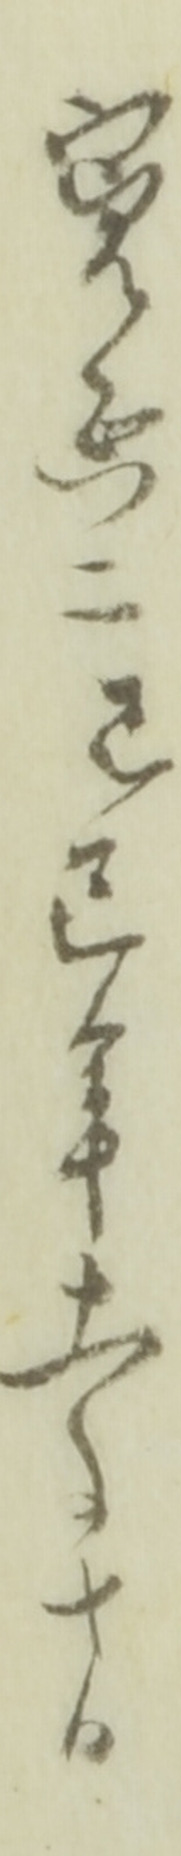寛延二巳年十一月十日
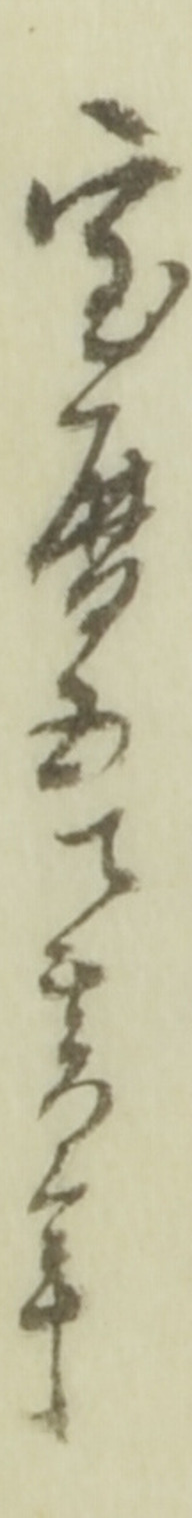宝暦五丁寅年
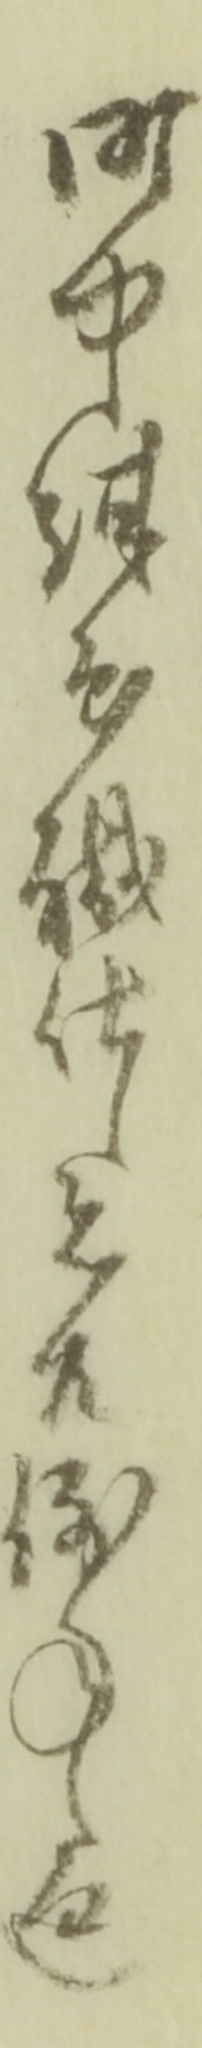町中紺屋職仕候者共例年之通
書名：御公儀様御領主様御触書控
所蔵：伊那市立高遠町図書館・合同会社AMANE
